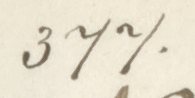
377.
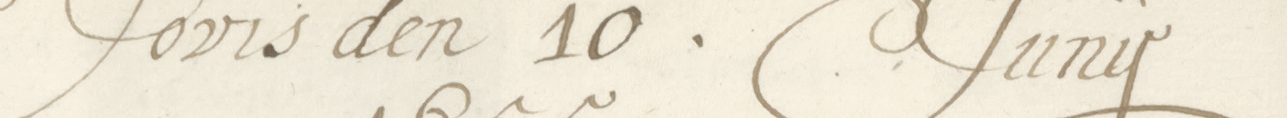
Jovis den 10en. Junij
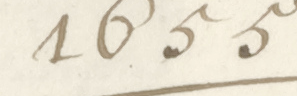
1655.
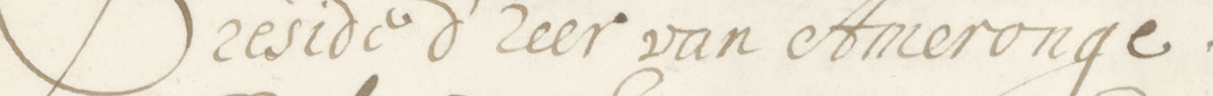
Preside d'heer van Ameronge.
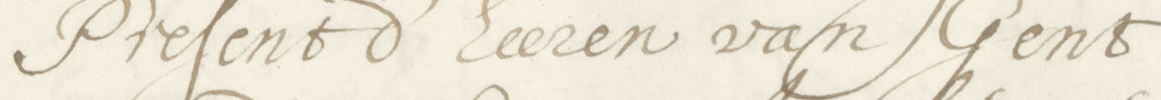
Present d'heeren van Gent,
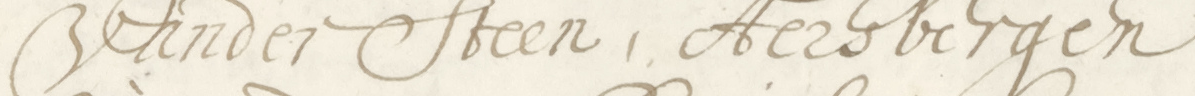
Vander Steen, Aersbergen,
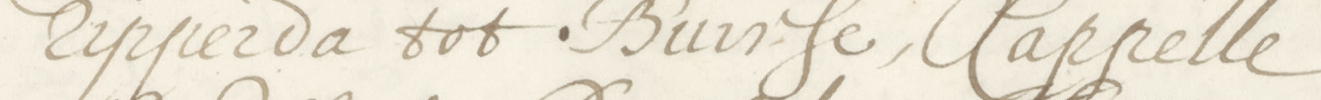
Ripperda tot Buirse, Cappelle
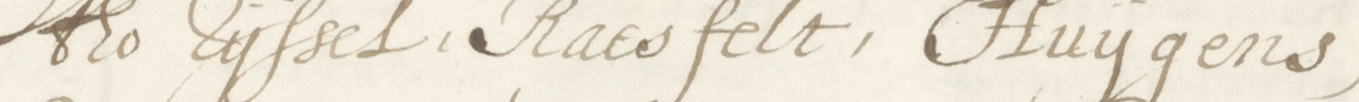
tho Rijssel, Raesfelt, Huijgens,
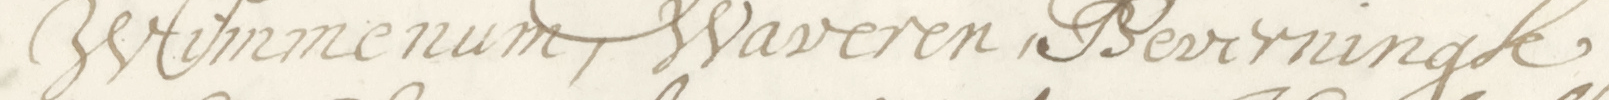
Wimmenum, Waveren, Beverningk,
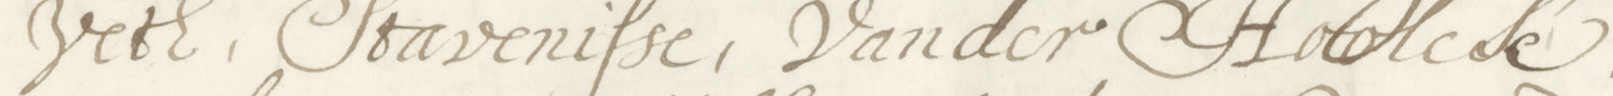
Veth, Stavenisse, Vander Hoolck.
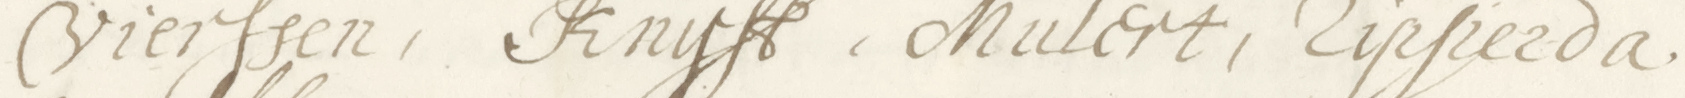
Vierssen, Knijff, Mulert, Ripperda,
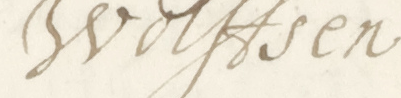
Wolffsen.
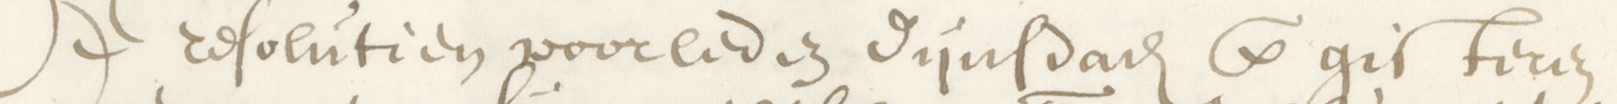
De resolutien voorleden dijnsdach & gisteren
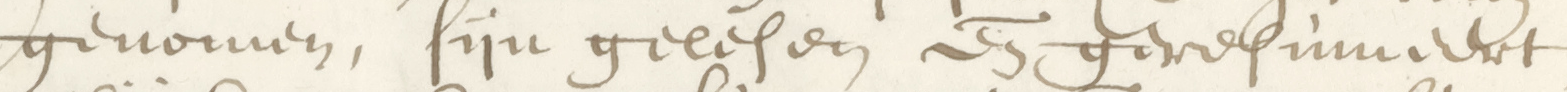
genomen, sijn gelesen en geresumeert
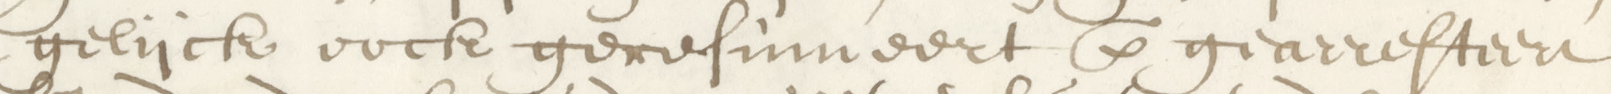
gelijck oock geresumeert & gearresteert
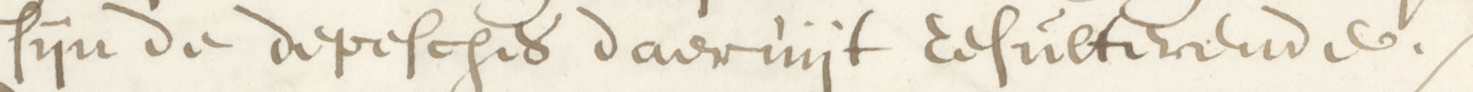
sijn de depesches daeruijt resulterende.
